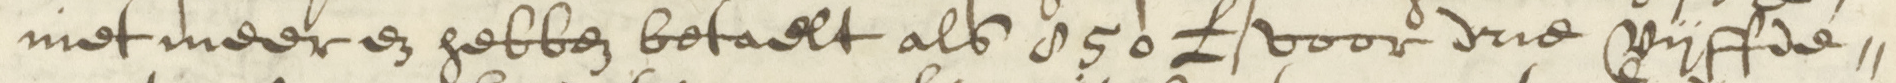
niet meer en hebben betaelt als 850 L, voor drie vijffde„
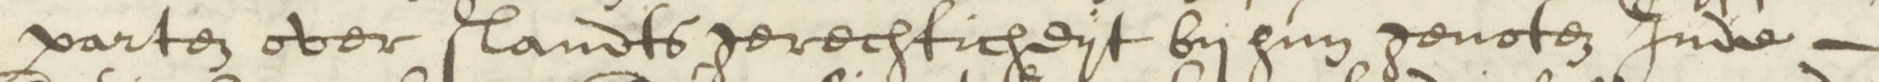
parten over slandts gerechticheijt bij hun genoten Inde —
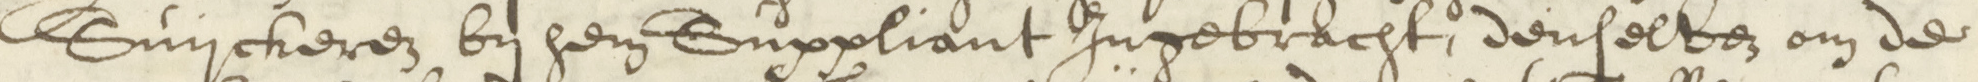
Suijckeren bij hem Suppliant Ingebracht, denselven om de
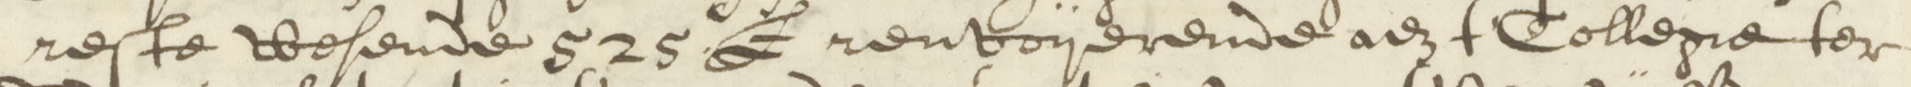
reste wesende 525 L renvoijerende aen t'Collegie ter
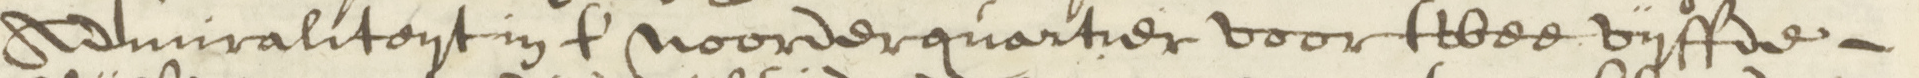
Admiraliteijt in t' Noorderquartier voor twee vijffde -
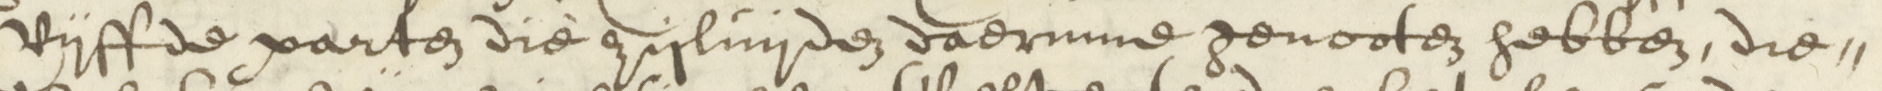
vijffde parten die zijluijden daerinne genooten hebben, die„
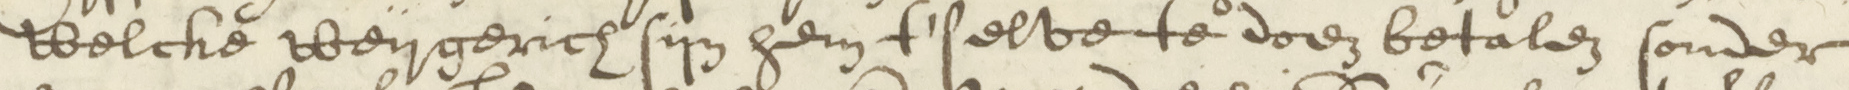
welcke weijgerich sijn hem t'selve te doen betalen sonder
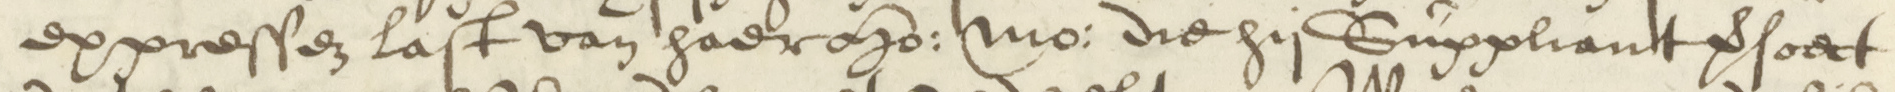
expressen last van haer Ho:Mo: die hij Suppliant vsoect
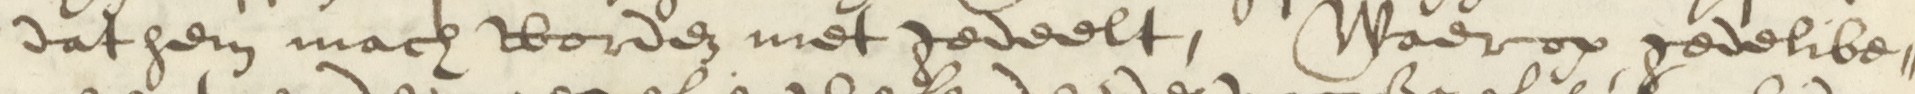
dat hem mach worden met gedeelt. Waerop gedelibe„
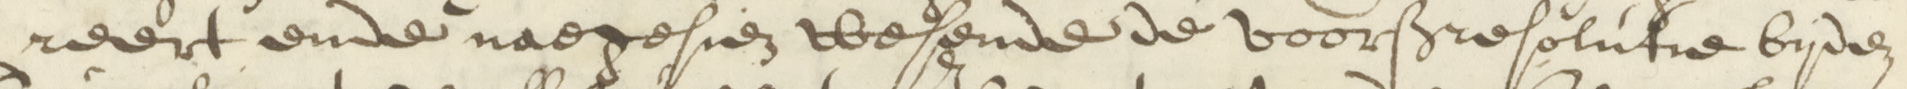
reert ende naegesien wesende de voorsz resolutie bijden
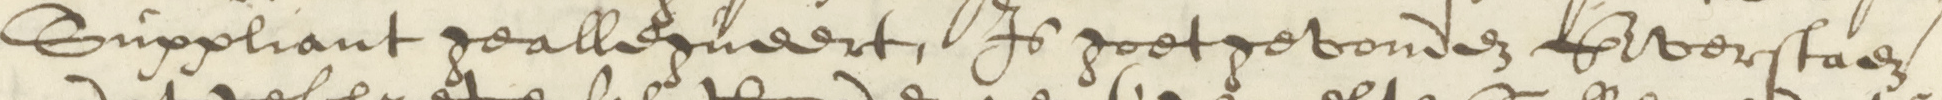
Suppliant geallegueert, Is goetgevonden & verstaen
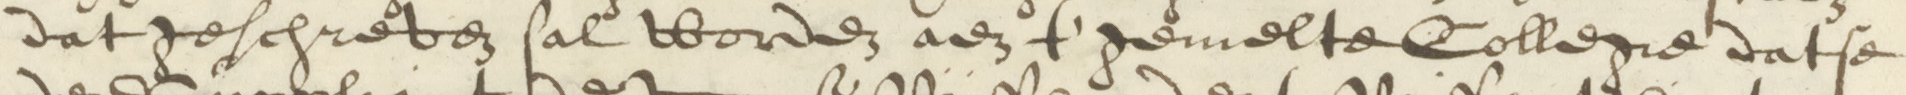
dat geschreven sal worden aen t'gemelte Collegie datse
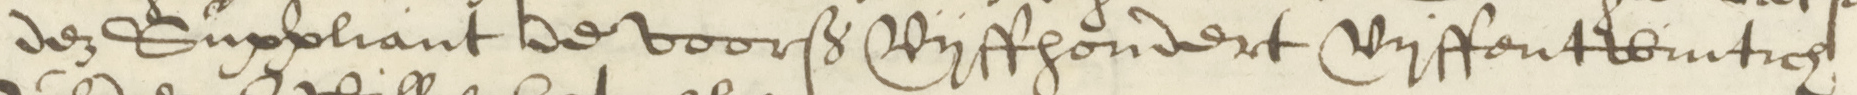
den Suppliant de voorsz vijffhondert vijffentwintich
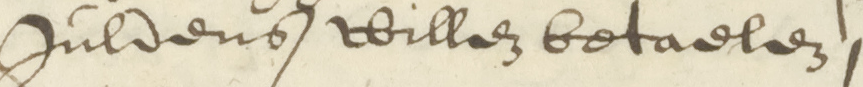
guldens willen betaelen.
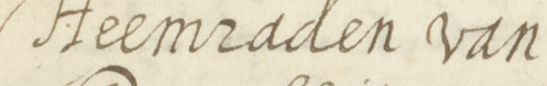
Heemraden van
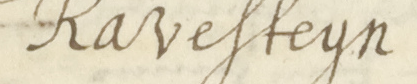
Ravesteijn
